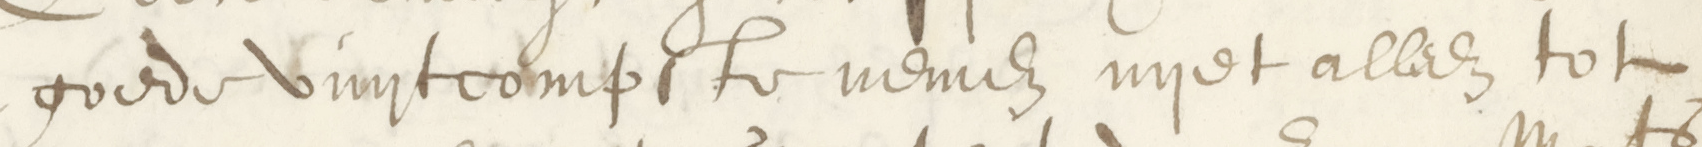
goede vuytcompste nemen nyet alleen tot
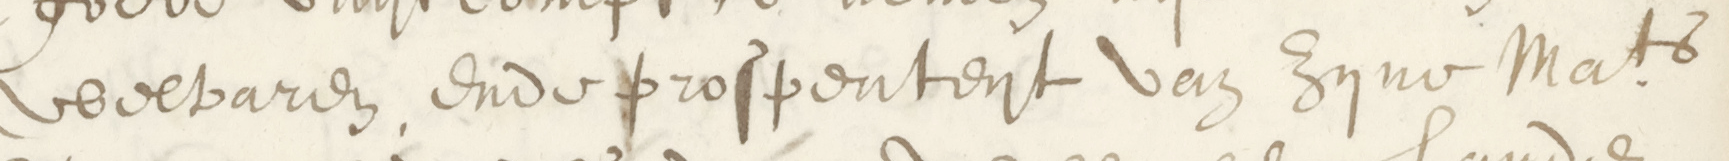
welvaren, ende prospenteyt van zyne Mats
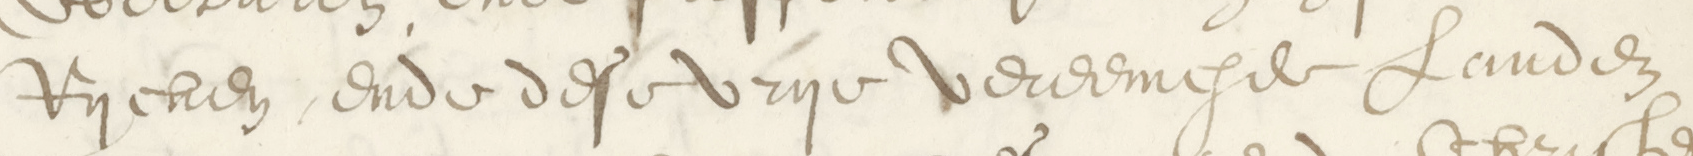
Rycken, ende dese vrye vereenichde Landen
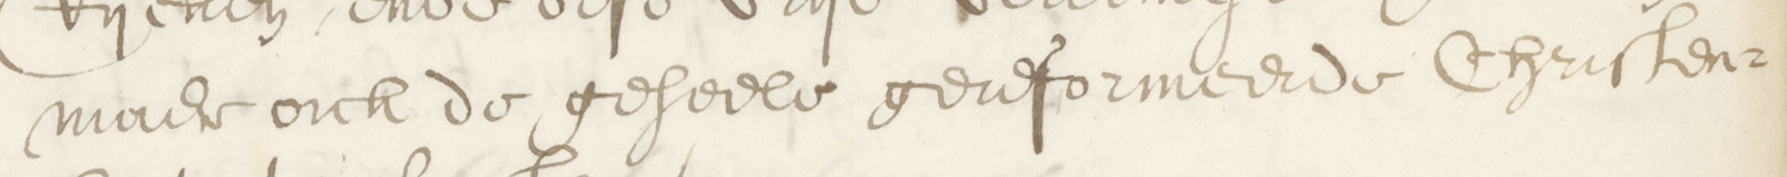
maer oick de geheele gereformeerde Christen:
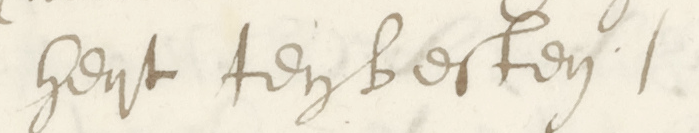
heyt ten besten.
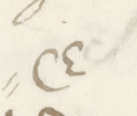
,,E
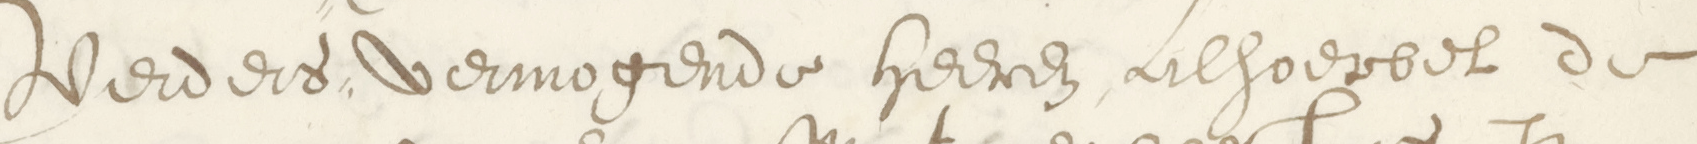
Verders,, vermogende heeren, Alhoewel de
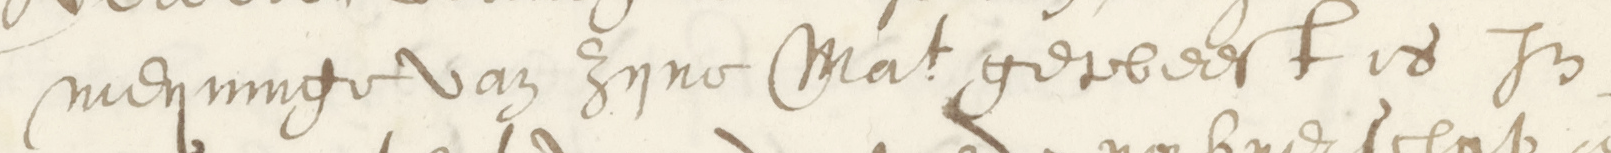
meyninge van zyne Mat. geweest is In
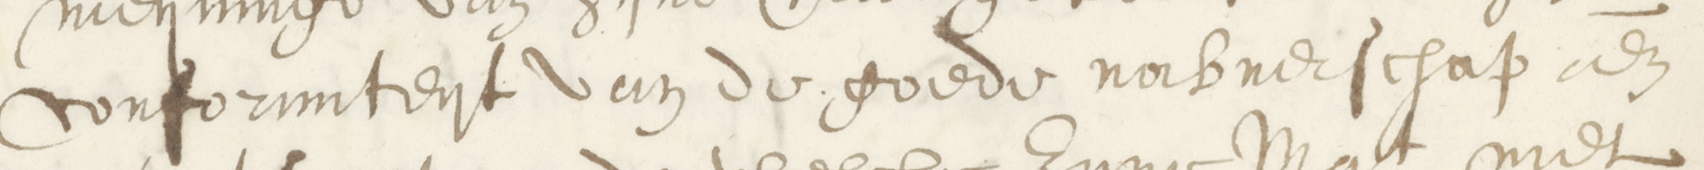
conformiteyt van de goede nabuerschap, en
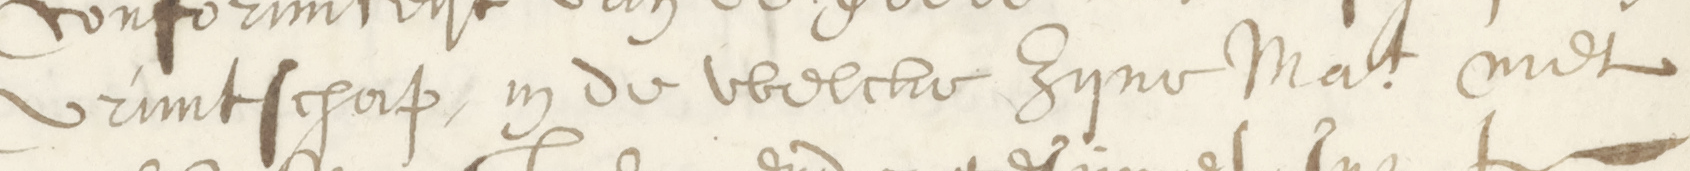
vruntschap, in de welcke zyne Mat met
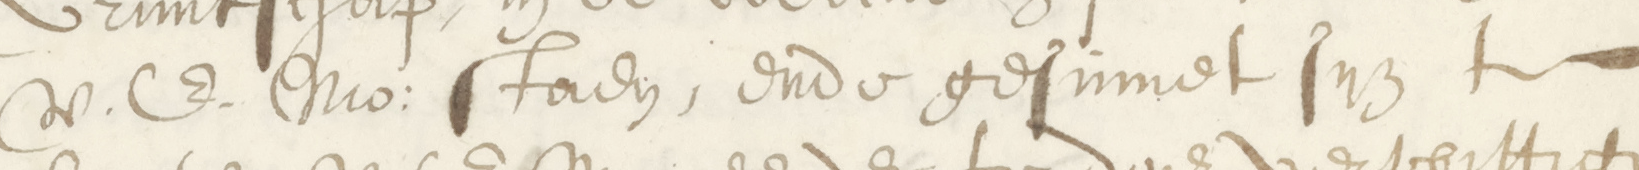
u. E. Mo: staen, ende gesinnet syn te
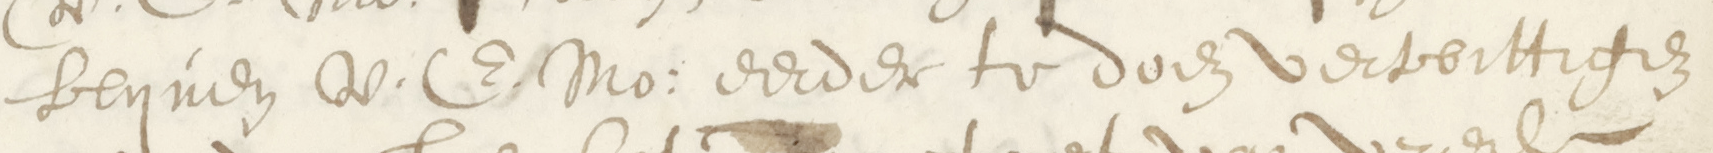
blyuen u. E. Mo: eerder te doen verwittigen
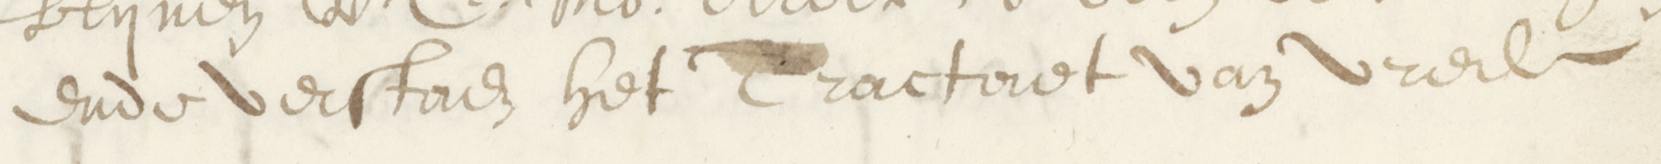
ende verstaen het Tractaet van vrede
